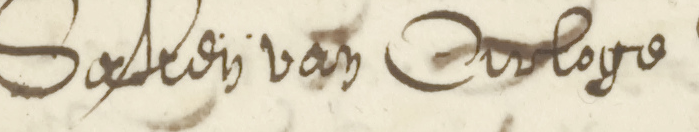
Sacken ven Oorloge
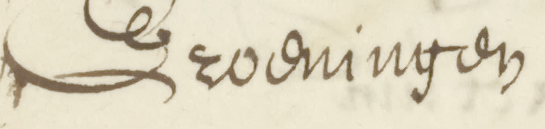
Groeningen
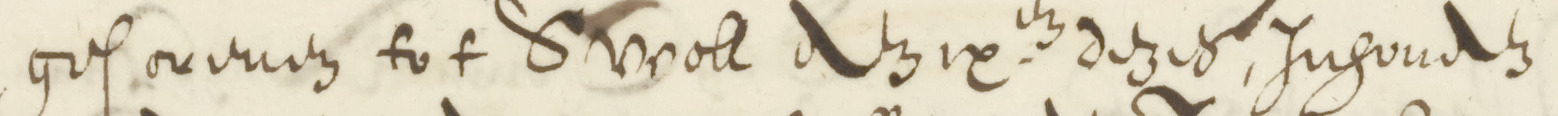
gescreuen tot Swoll den ixen dezes, Inhouden
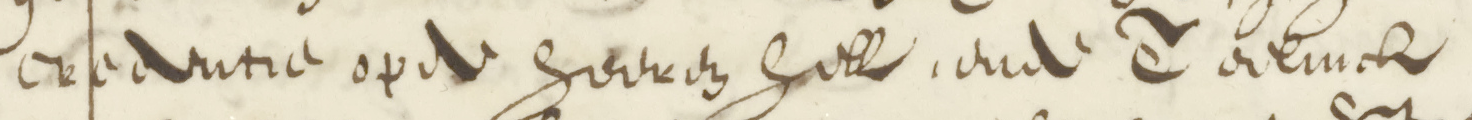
credentie opde heeren Hell ende Teelinck
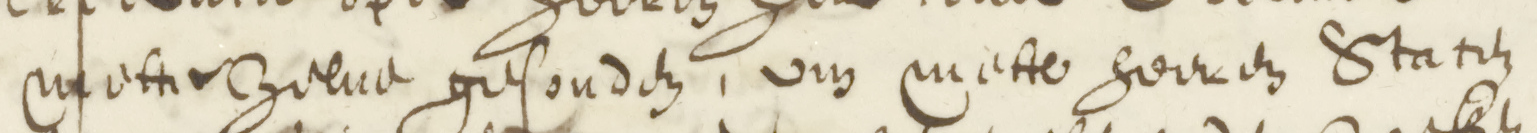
mette zelue gesonden, om mette heeren Staten
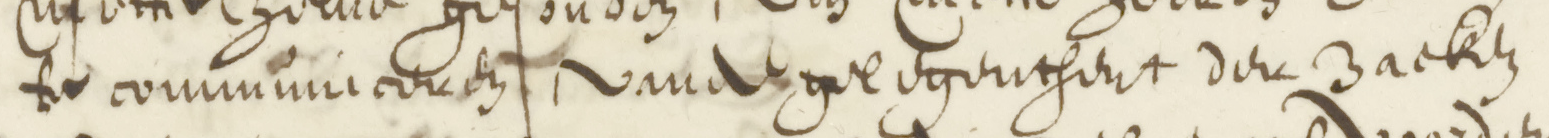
te communiceren, vande gelegentheyt der zaeken
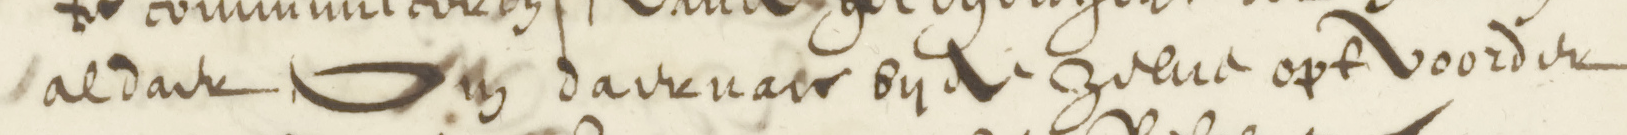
aldaer, Om daernaer byde zelue opt voorder
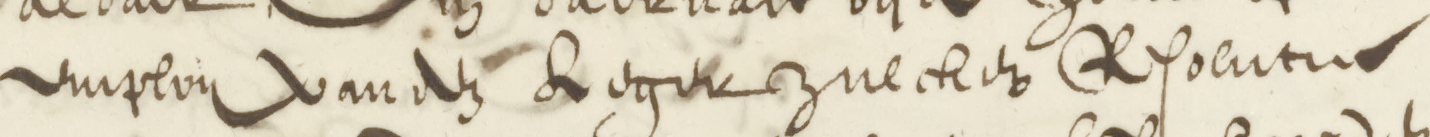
employ van den Leger zulcken Resolutie
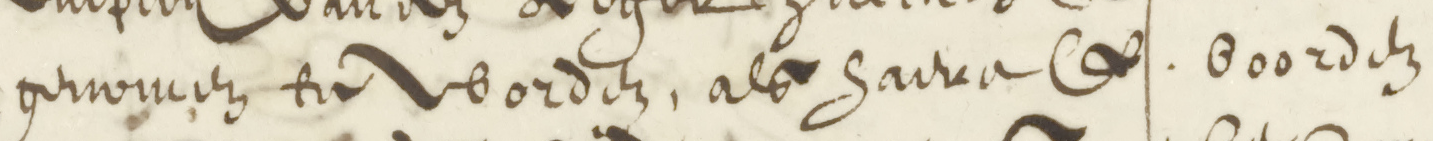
genomen te worden, als haere E. voorden
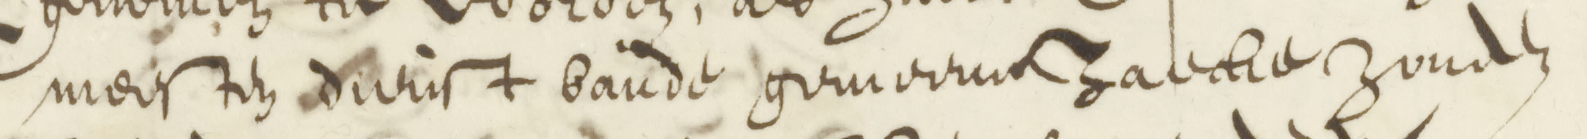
meesten dienst vande gemeene zaecke zouden
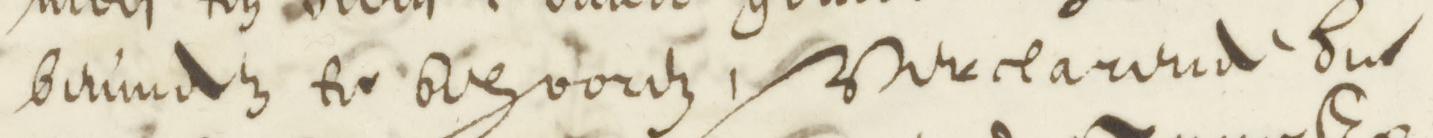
beuinden te behooren. Verclarende die
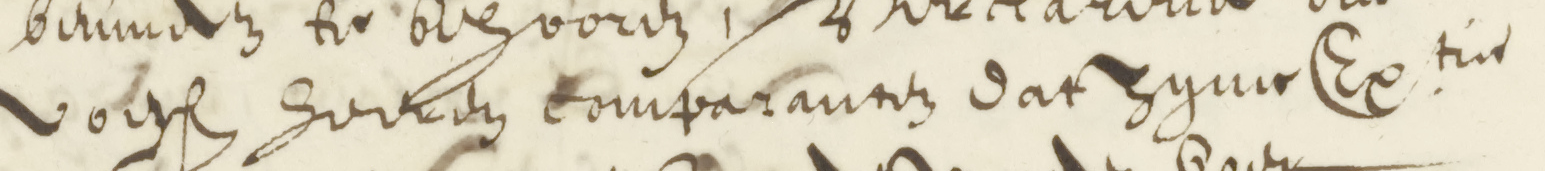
voers heeren comparanten dat zyne Extie
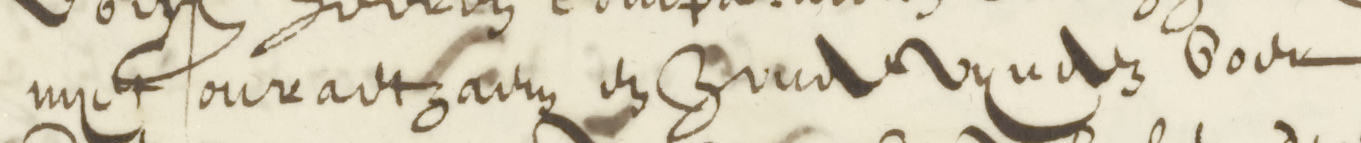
nyet onraetzaem en zoude vynden voer
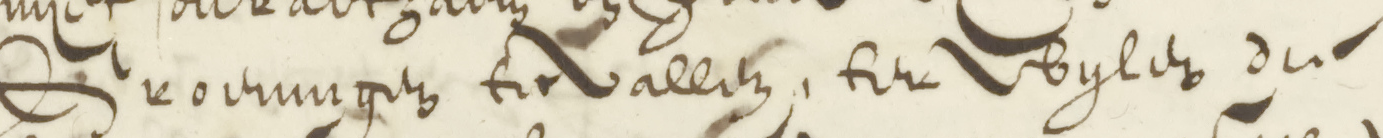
Groeningen te vallen, ter wylen die
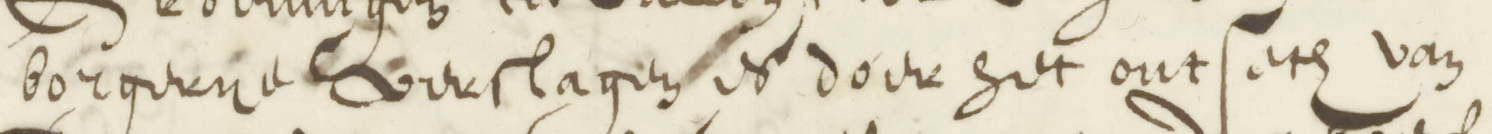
borgerye verslagen is doer het ontseth van
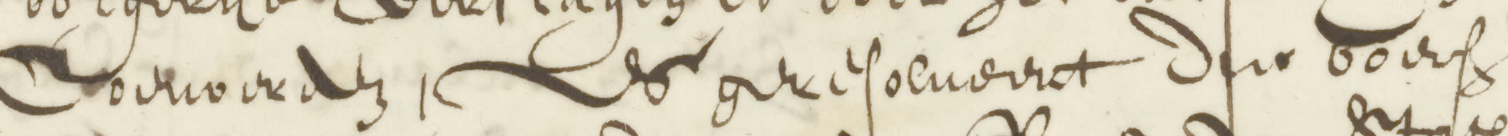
Coeverden, Es geresolueert den voers
